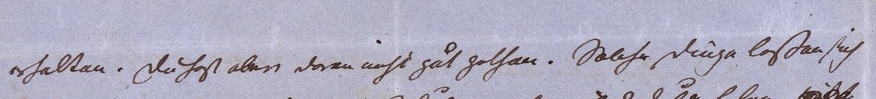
erhalten. Du hast aber daran nicht gut gethan. Solche Dinge laßen sich
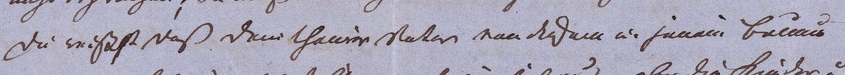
Du weißst daß dein theurer Vater von diesem u. jenem Baume
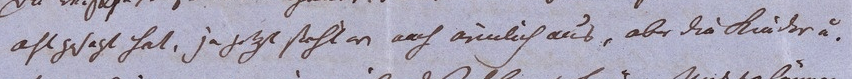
oft gesagt hat, ja jetzt sieht er noch ärmlich aus, aber die Kinder u.
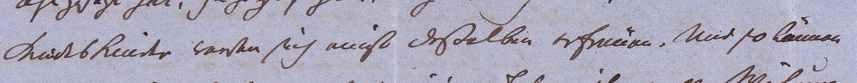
Kindeskinder werden sich einst deßelben erfreuen. Und so können
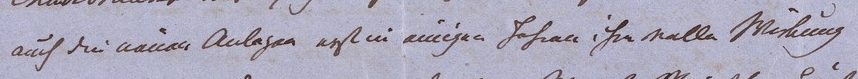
auch die neuen Anlagen erst in einigen Jahren ihre volle Wirkung
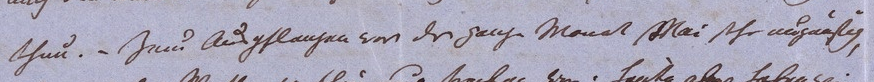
thun. – Zum Auspflanzen war der ganze Monat Mai sehr ungünstig,
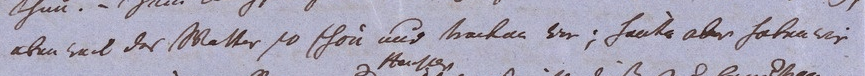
eben weil das Wetter so schön und trocken war; heute aber haben wir
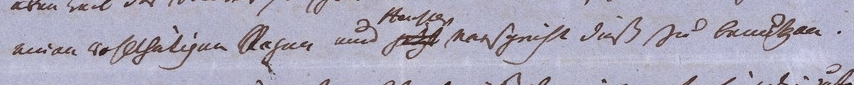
einen wohlthätigen Regen und jetztHeusser verspricht dieß zu benutzen.
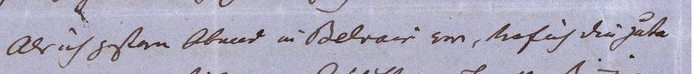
Als ich gestern Abend in Belvoir war, traf ich die gute
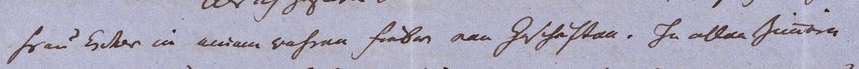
Frau Escher in einem wahren Fieber von Geschäften. In allen Zimmern
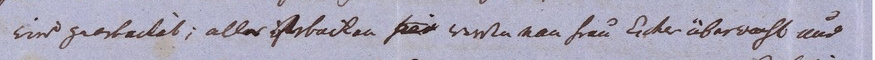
wird gearbeitet; alle Arbeiten ... werden von Frau Escher überwacht und
